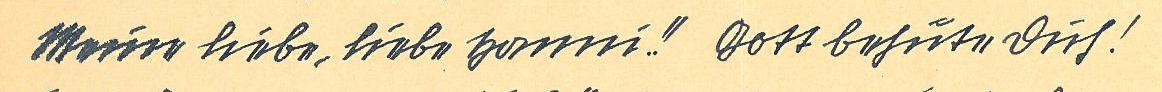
Meine liebe, liebe !! Gott behüte Dich!
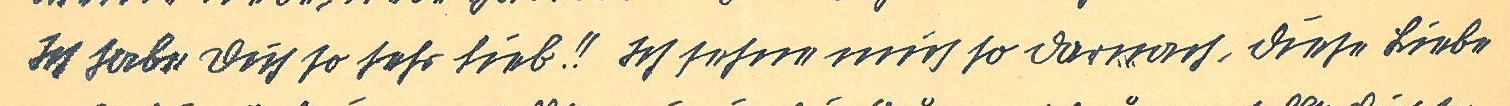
Ich habe Dich so sehr lieb!! Ich sehne mich so darnach, diese Liebe
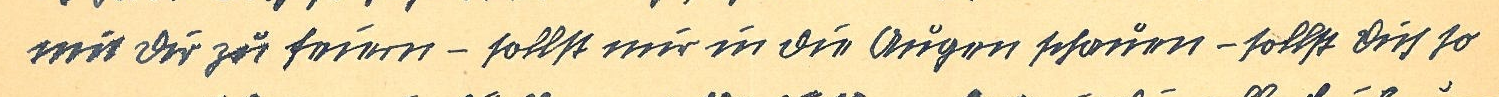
mit Dir zu feiern – sollst mir in die Augen schauen – sollst Dich so
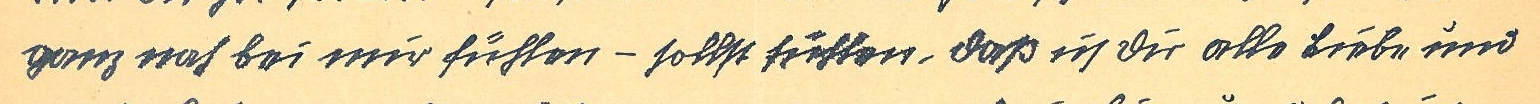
ganz nah bei mir fühlen – sollst fühlen, daß ich Dir alle Liebe und
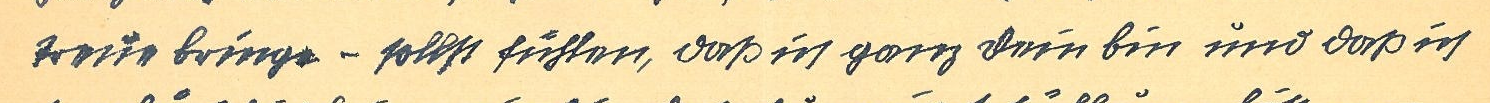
Treue bringe – sollst fühlen, daß ich ganz Dein bin und daß ich
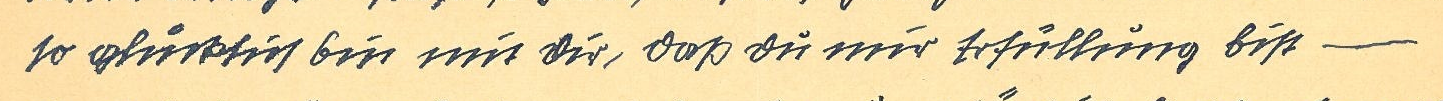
so glücklich bin mit Dir, daß Du mir Erfüllung bist —
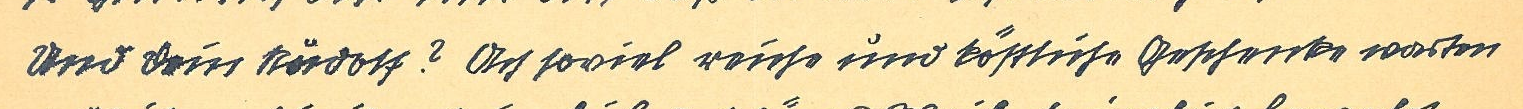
Und Dein ? Ach soviel reiche und köstliche Geschenke warten
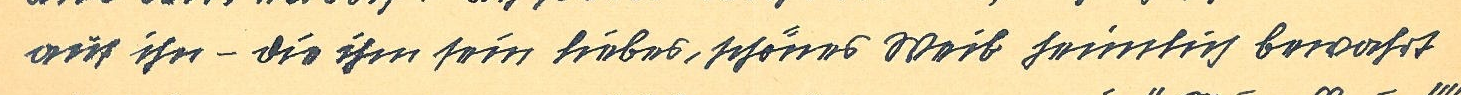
auf ihn – die ihm sein liebes, schönes Weib heimlich bewahrt
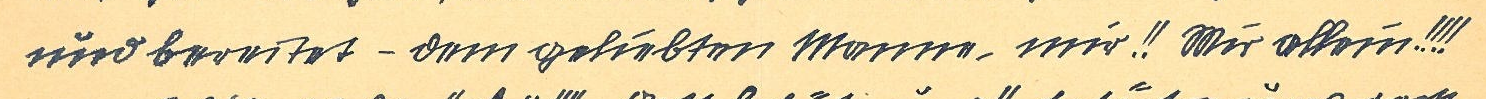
und bereitet – dem geliebten Manne, mir!! Mir allein!!!!!
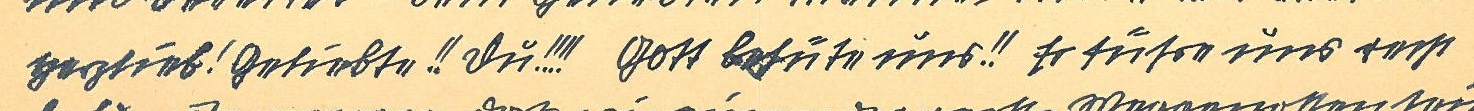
Herzlieb! Geliebte!! Du!!!! Gott behüte uns!! Er führe uns recht
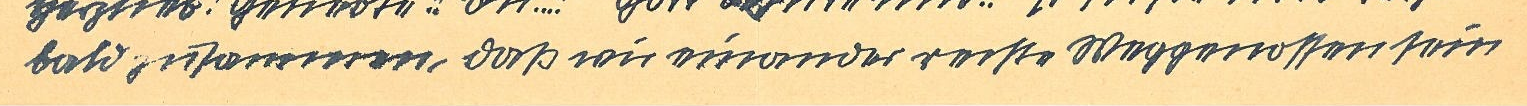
bald zusammen, daß wir einander rechte Weggenossen sein
